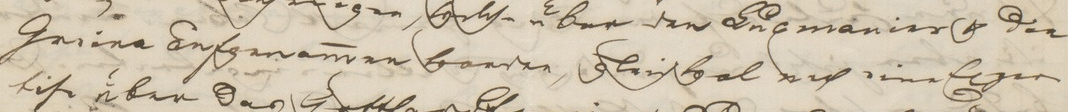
Greina aufgenommen worden, gleichwol noch eine Exper-
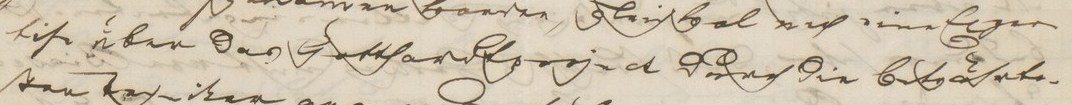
tise über das Gotthardtproject durch die bewährte-
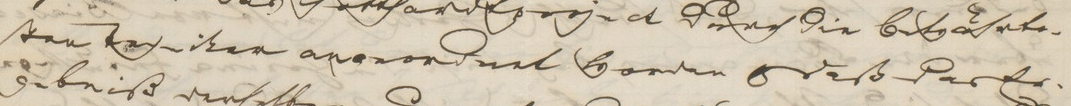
sten Techniker angeordnet worden & daß das Er-
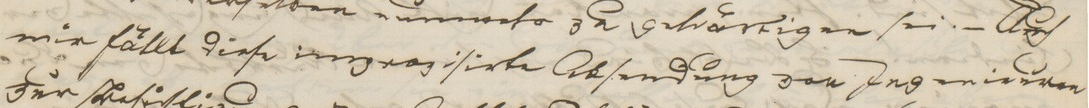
mir fällt diese improvisirte Absendung von Ingenieuren
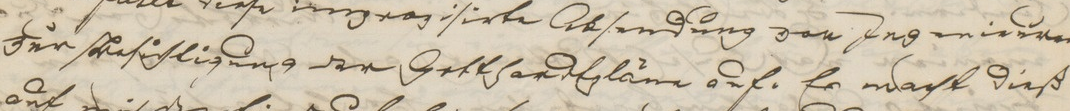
zur Besichtigung der Gotthardtpläne auf. Es macht dieß
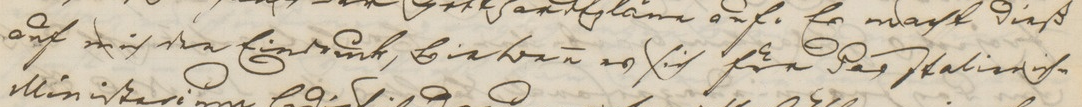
auf mich den Eindruck, wie wenn es sich für das Italienische
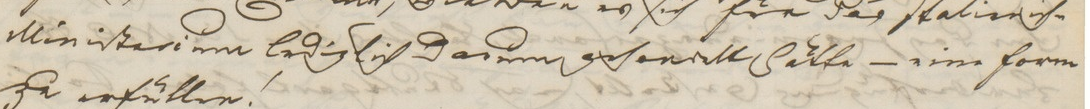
Ministerium lediglich darum gehandelt hätte – eine Form
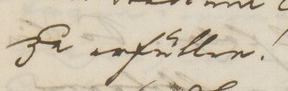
zu erfüllen!
